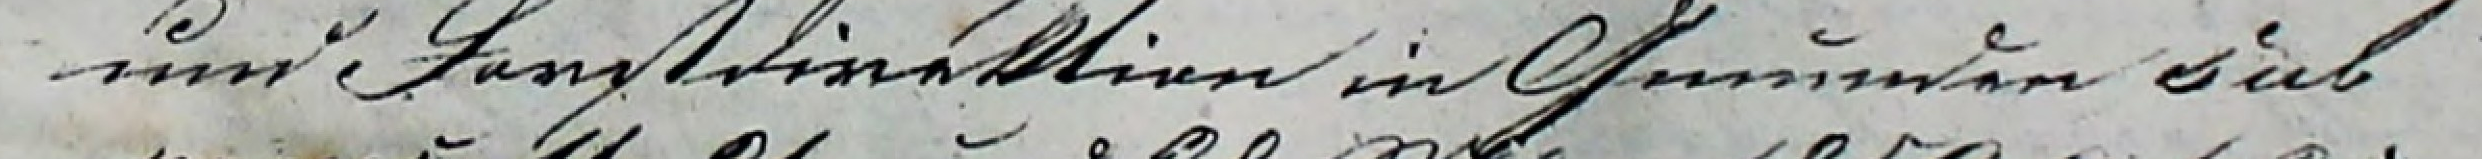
und Forstdirektion in Gmunden sab
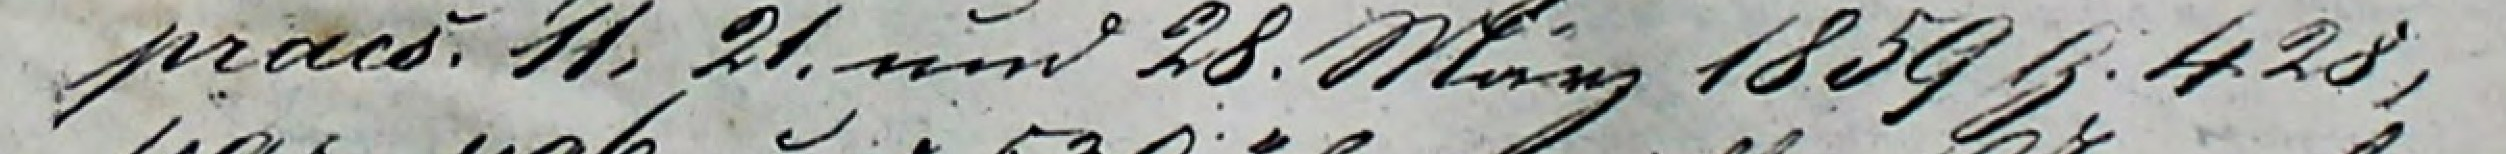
pracs. 11, 21, und 28. März 1859 Z. 428,
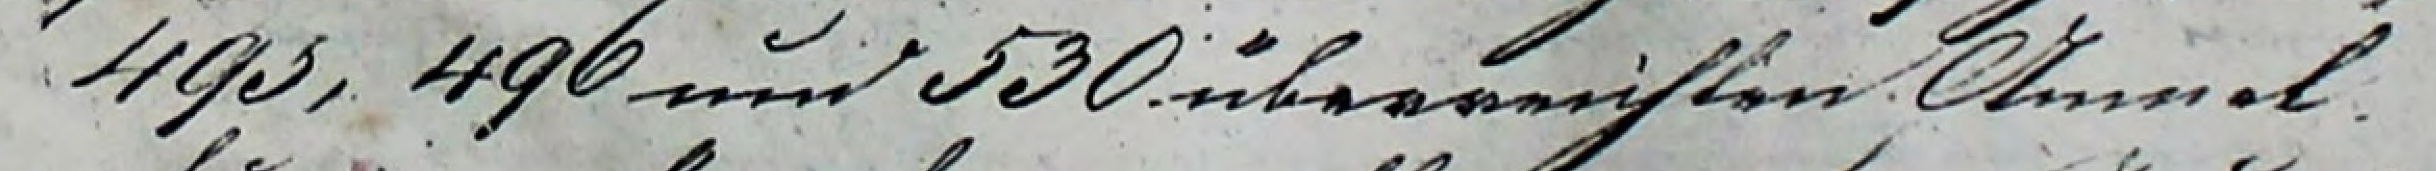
493, 496 und 530 überreichten Anmel„
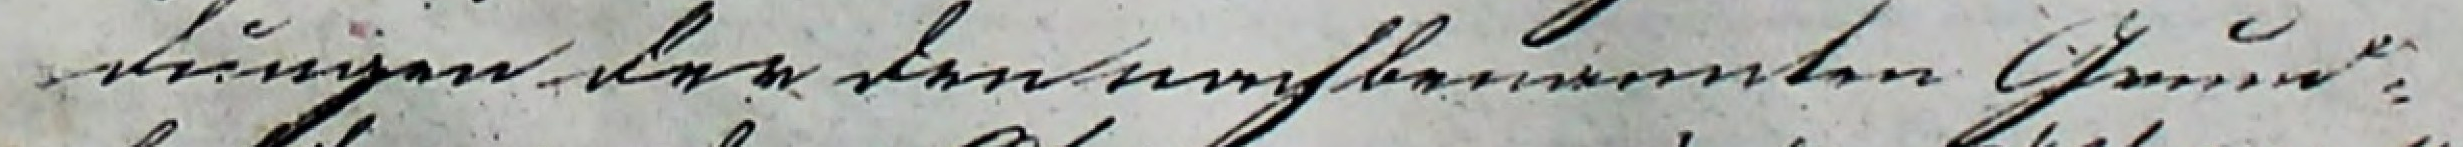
dungen der den nach benannten Grund„
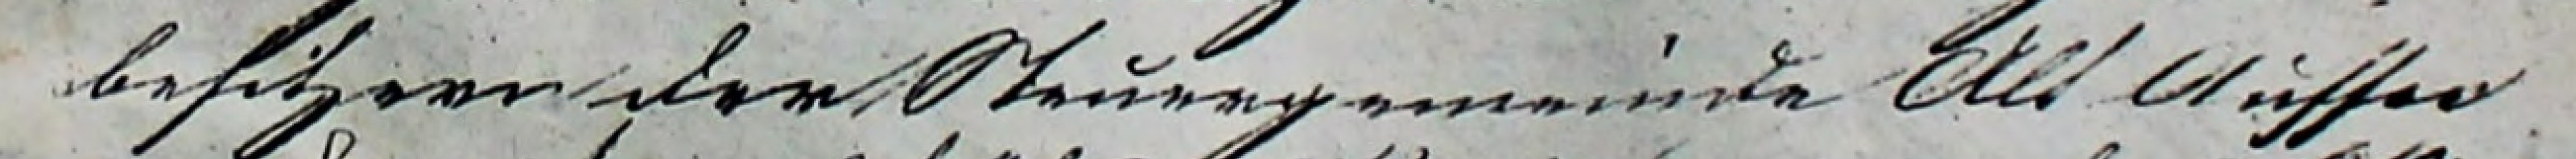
besitzern der Steuergemeinde Alt Aussee
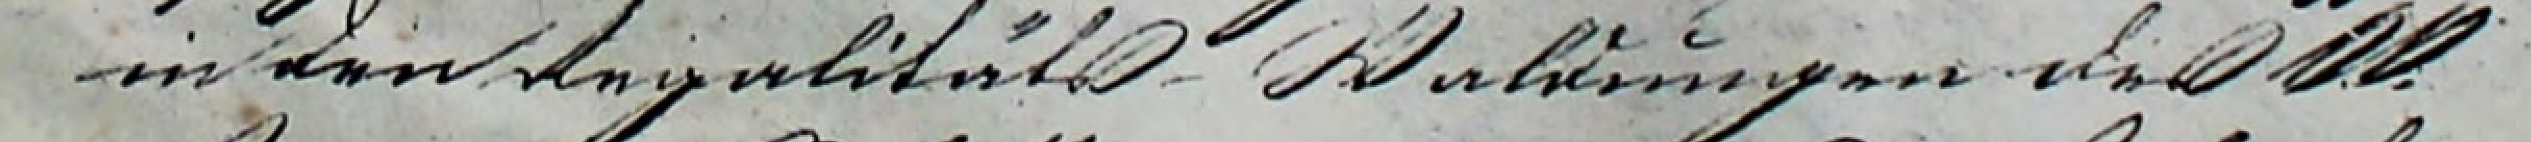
in den Regalitäts - Waldungen des kk.
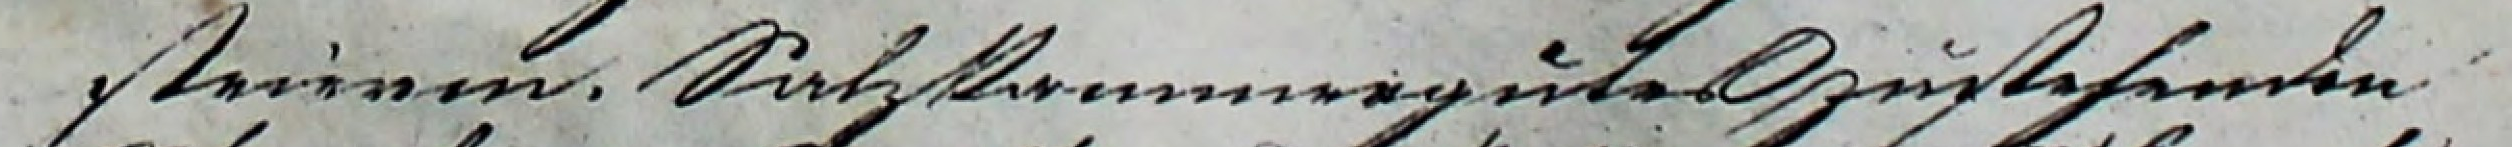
steierm. Salzkammergutes zustehenden
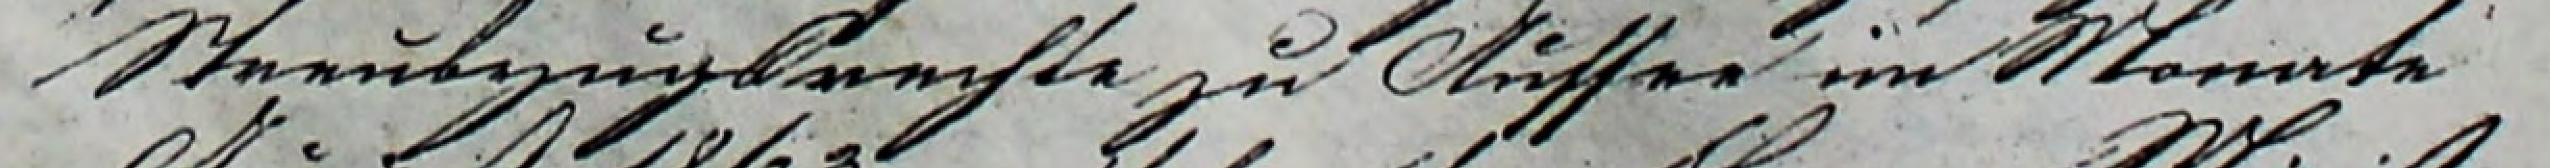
Streubezugsrechte zu Aussee im Monate
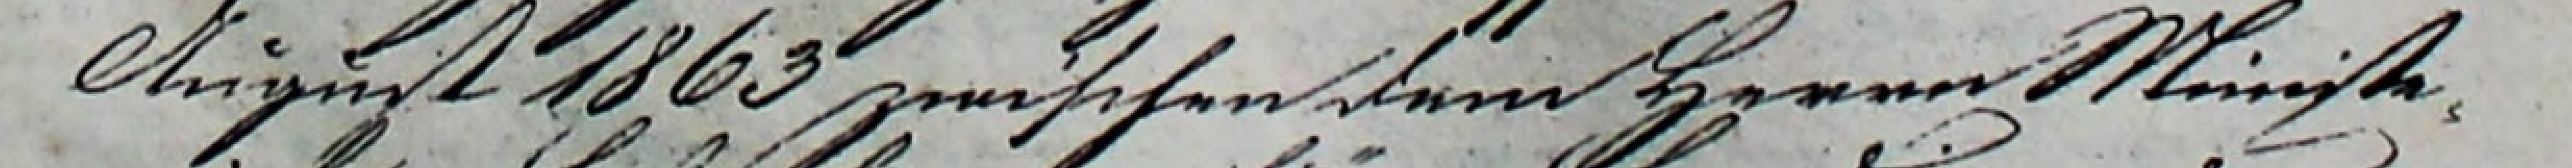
August 1863 zwischen dem Herrn Ministe„
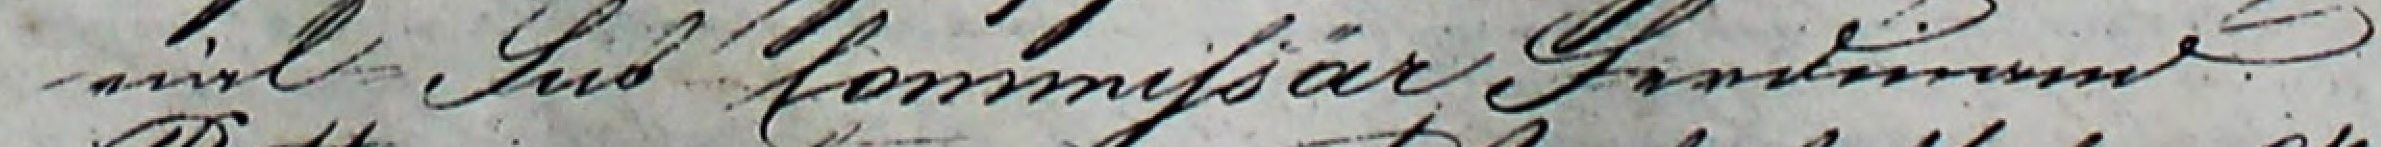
rial Sub Commissär Ferdinand
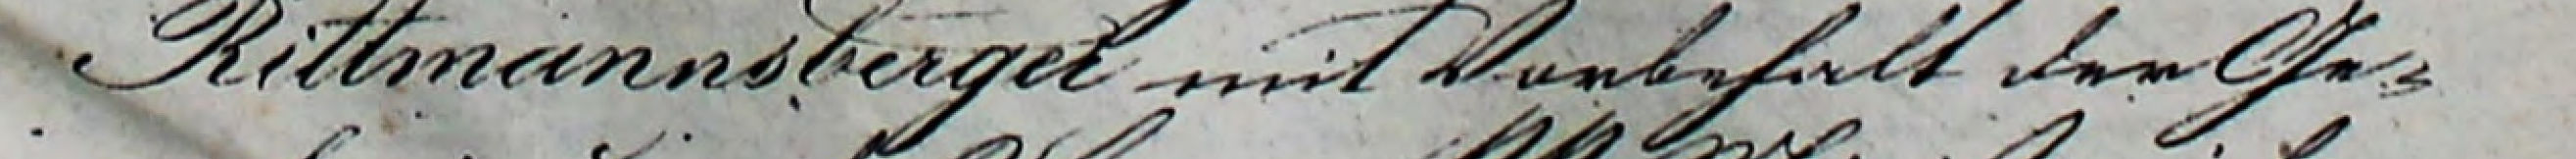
Rittmannsberger mit Vorbehalt der Ge„
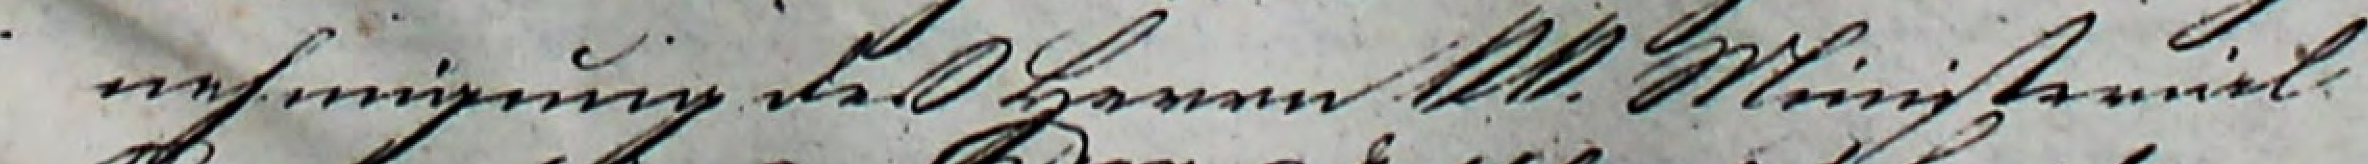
nehmigung des Herrn kk. Ministerial
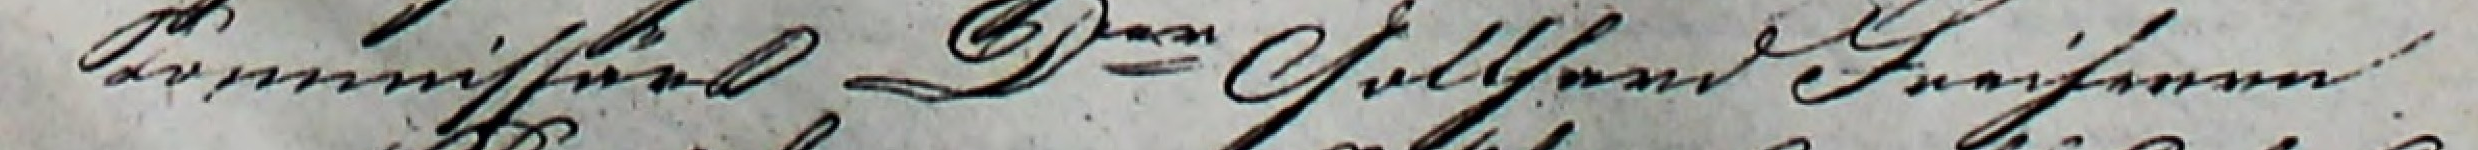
Kommissärs Dr Golland Freiherrn
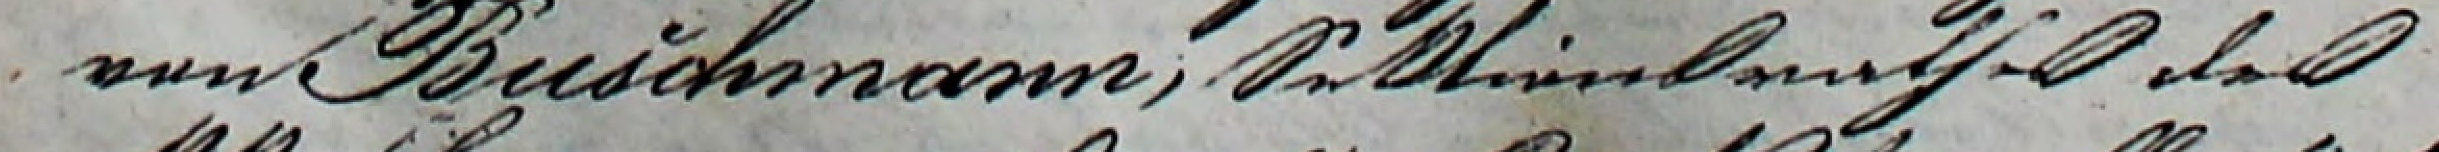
von Buschmann, Sektionsrathes des
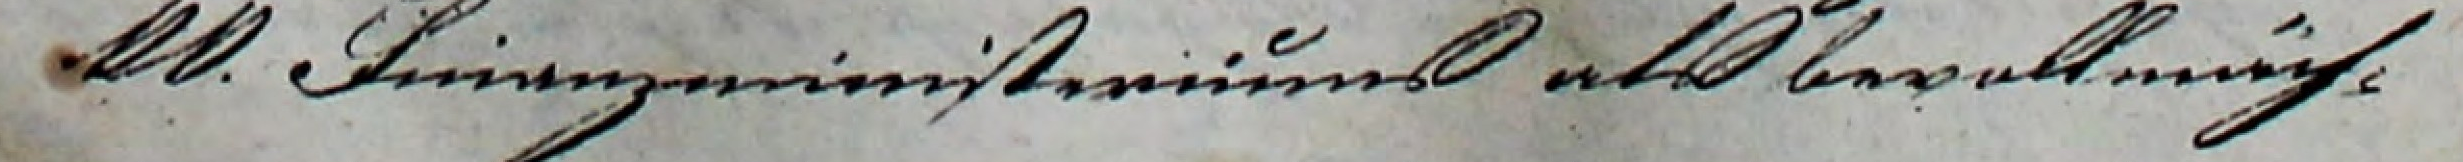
kk. Finanzministeriums als bevollmäch„
